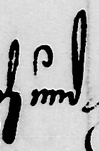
si¬
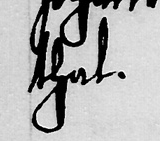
tfel¬
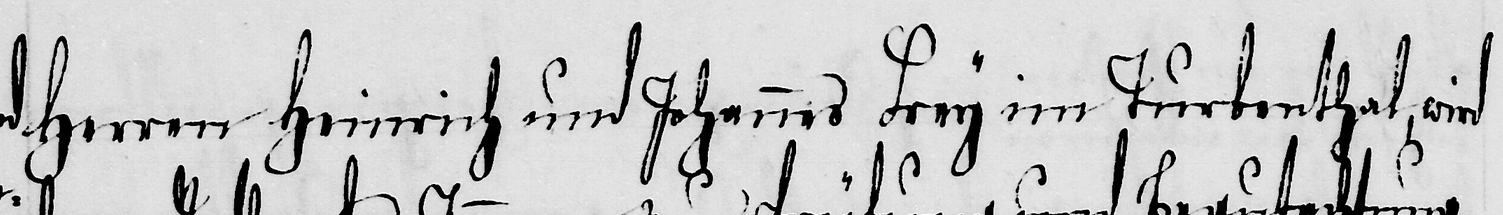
Herren Heinrich und Johannes Frey im Turbenthal, w¬
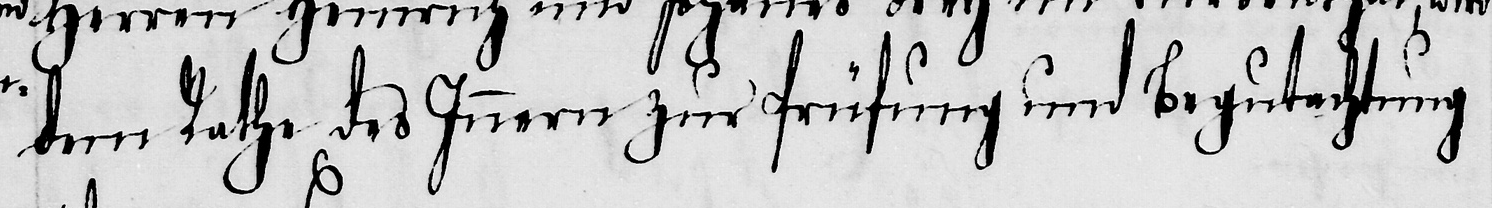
dem Rathe des Innern zur Prüfung und Begutachtung
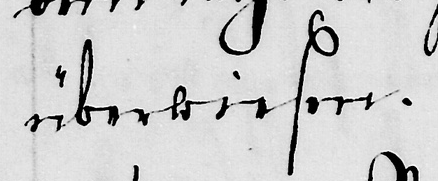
überwiesen.
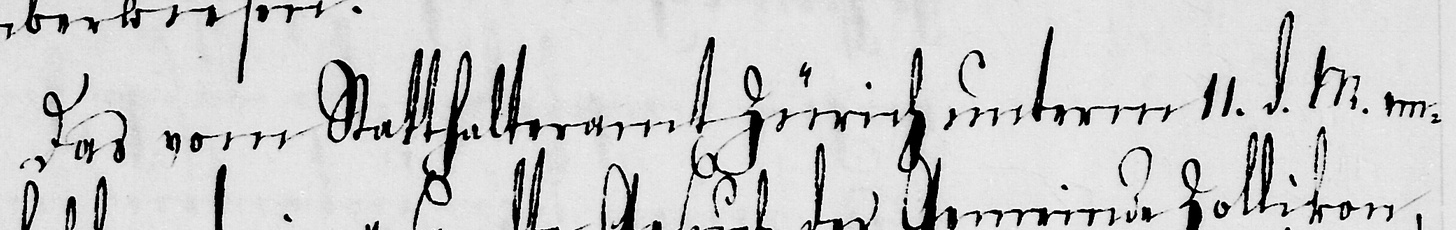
Das vom Statthalteramt Zürich unterm 11. d. M. e¬
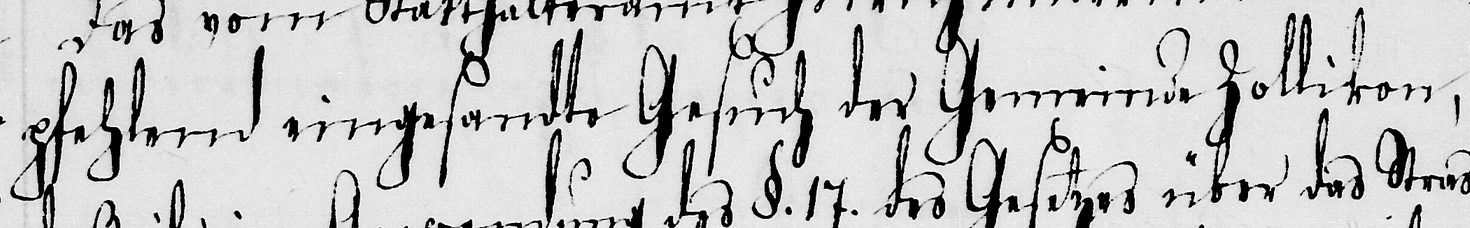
pfehlend eingesandte Gesuch der Gemeinde Zollikon,
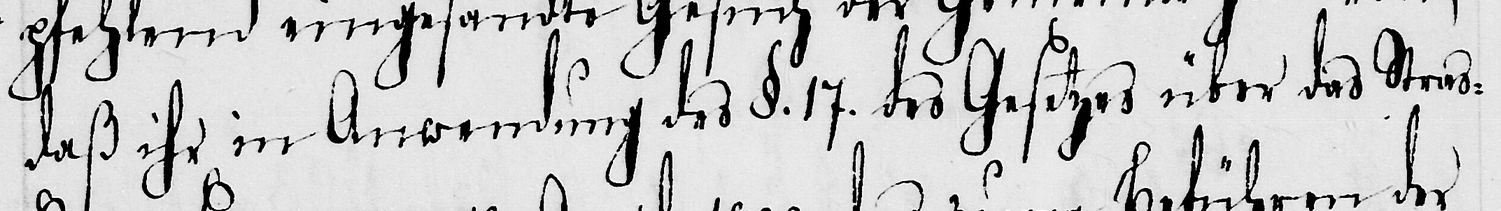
daß ihr in Anwendung des §. 17. des Gesetzes über das Straß¬
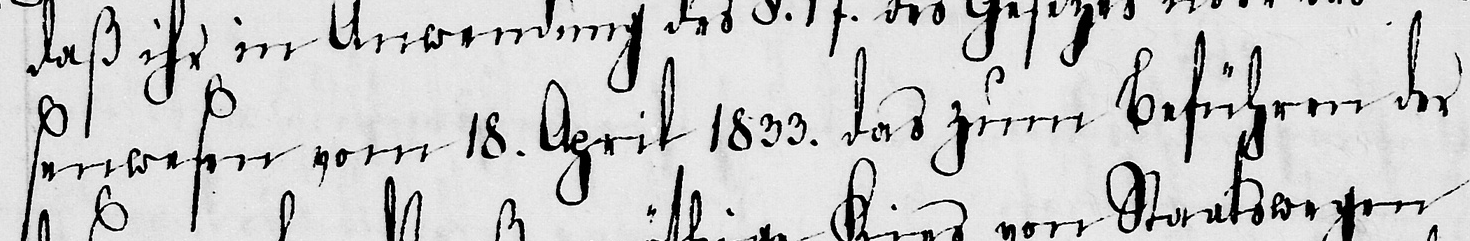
enwesen vom 18. April 1833. das zum Beführen der
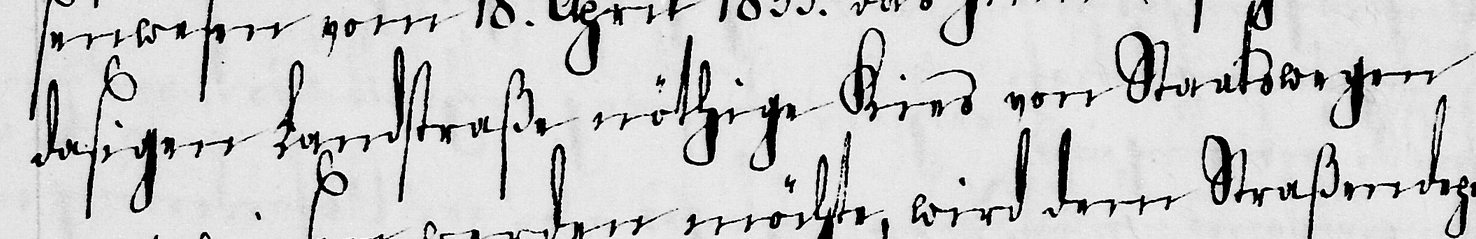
dasigen Landstraße nöthige Kies von Staatswegen
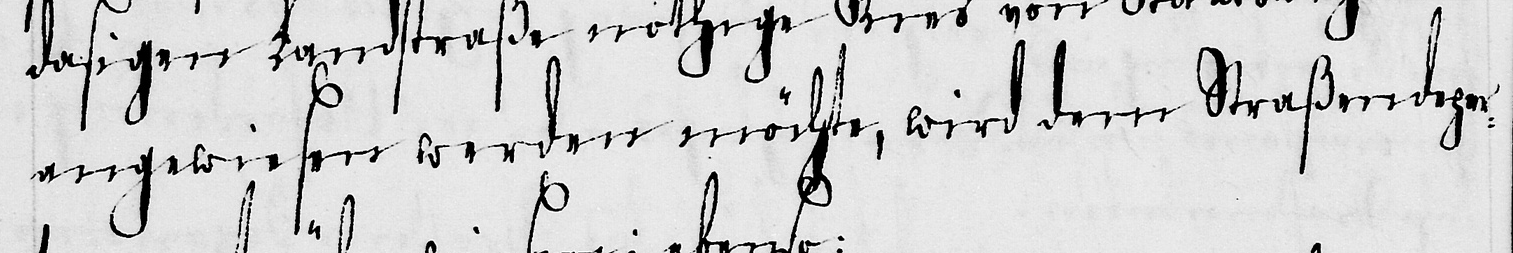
angewiesen werden möchte, wird dem Straßendepa¬
